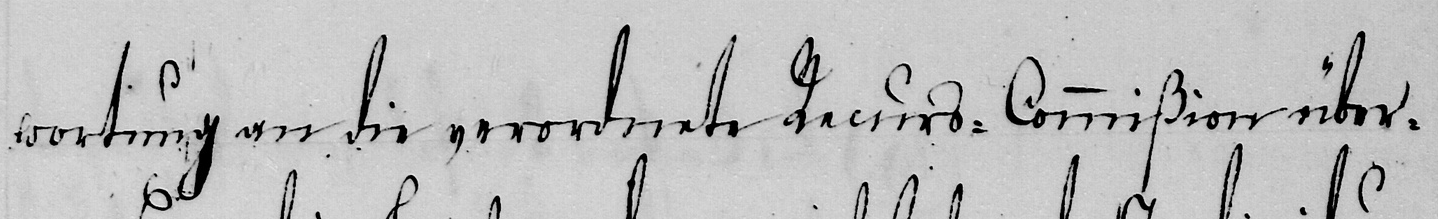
wortung an die verordnete Recurs-Commißion über¬
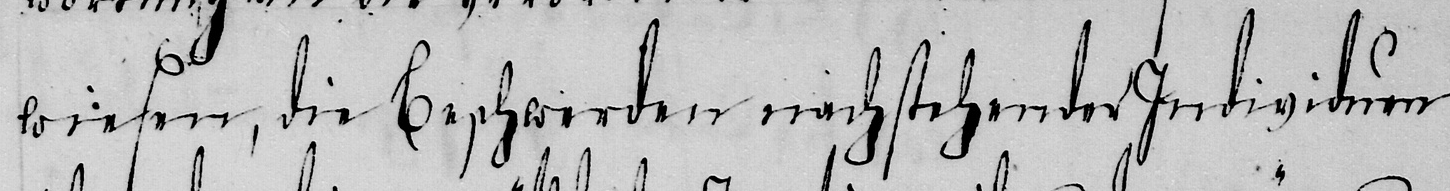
wiesen, die Beschwerden nachstehender Individuen
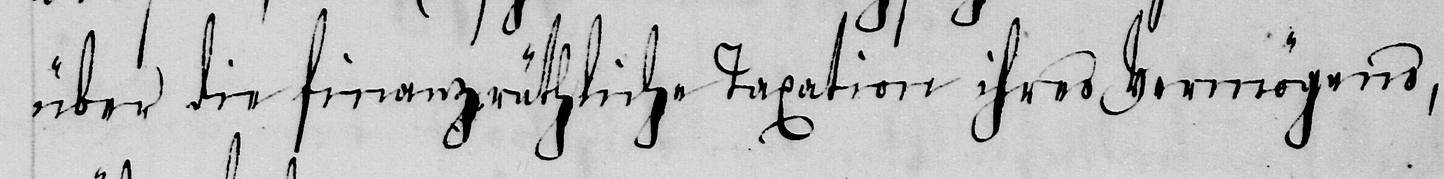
über die finanzräthliche Taxation ihres Vermögens,
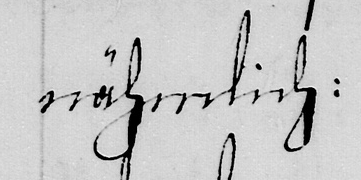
nähmlich:
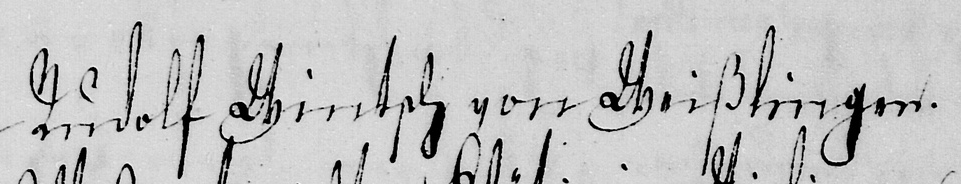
Rudolf Wintsch von Weißlinen.
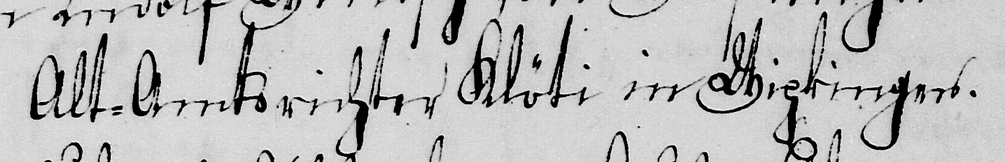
Alt-Amtsrichter Klöti in Wipkingen.
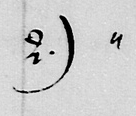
3.)
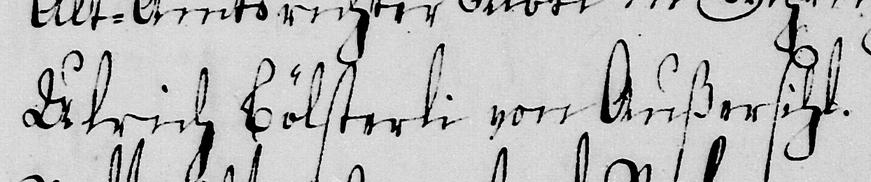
Ulrich Bölsterli von Außersihl.
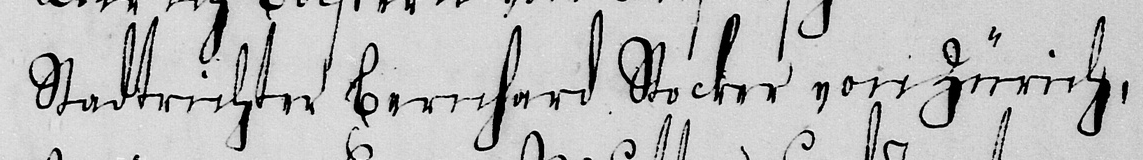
Stadtrichter Bernhard Stocker von Zürich,
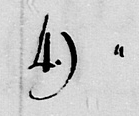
4.)
